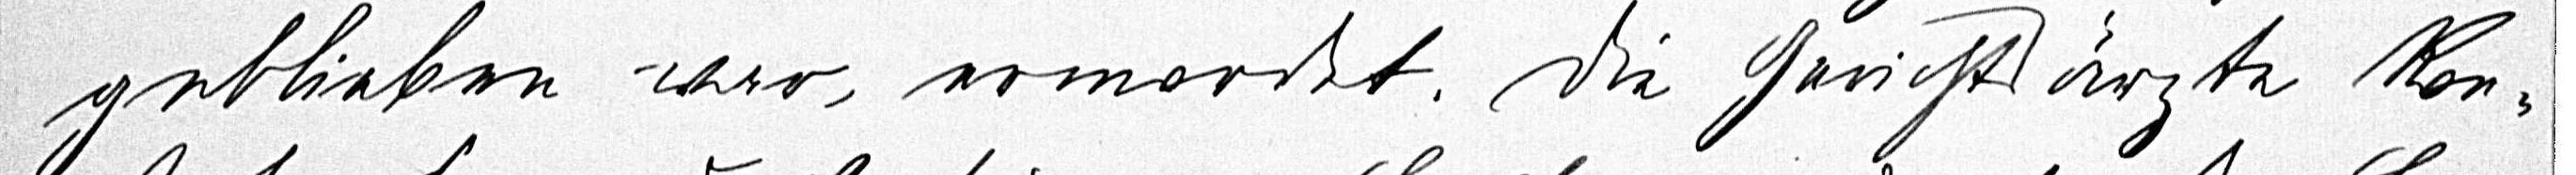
geblieben war, ermordet. Die Gerichtsärzte kon¬
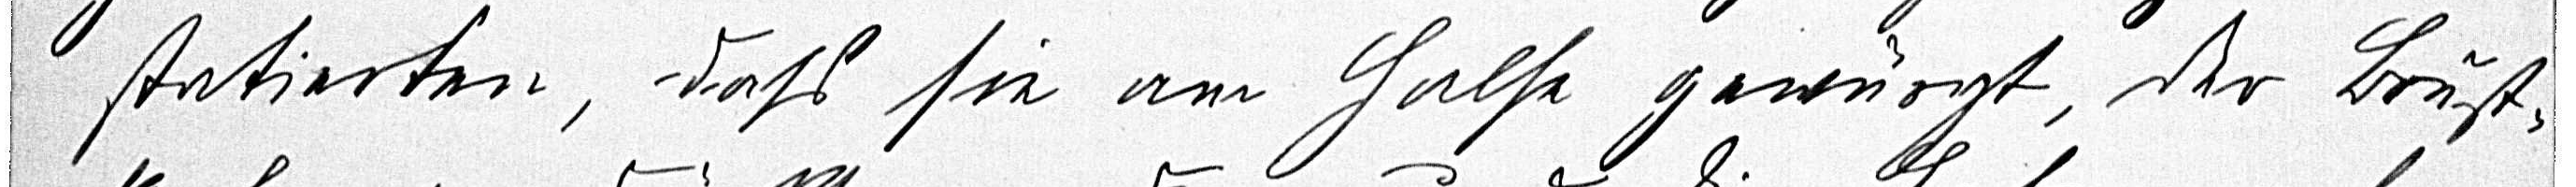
statierten, daß sie am Halse gewürgt, der Brust¬
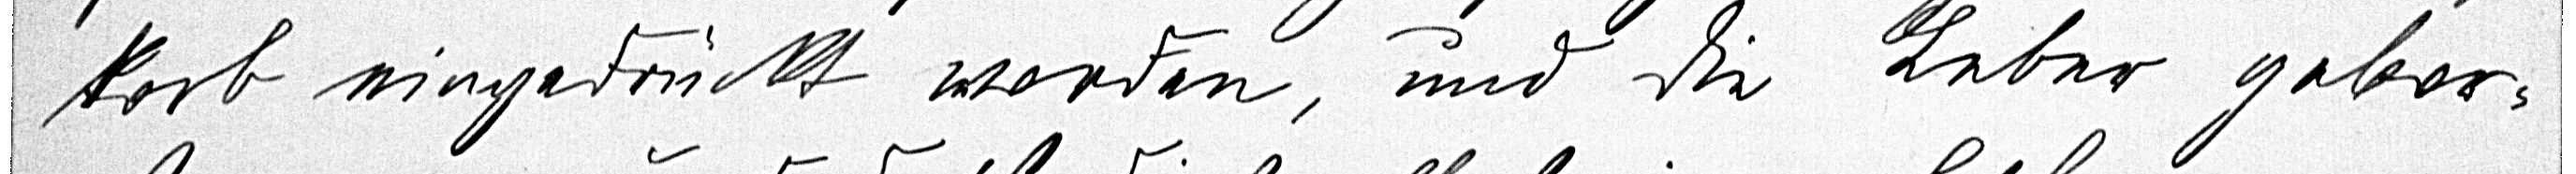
korb eingedrückt worden, und die Leber gebor¬
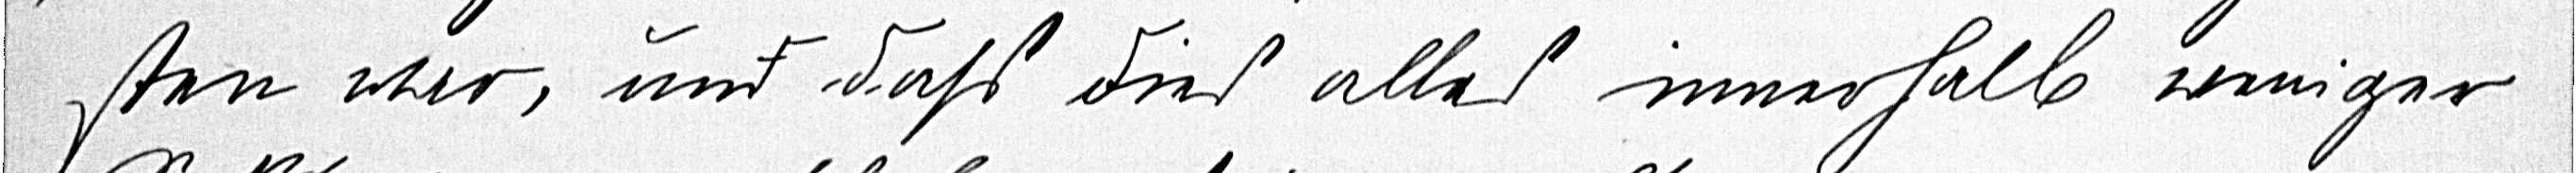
sten war, und daß dies alles innerhalb weniger
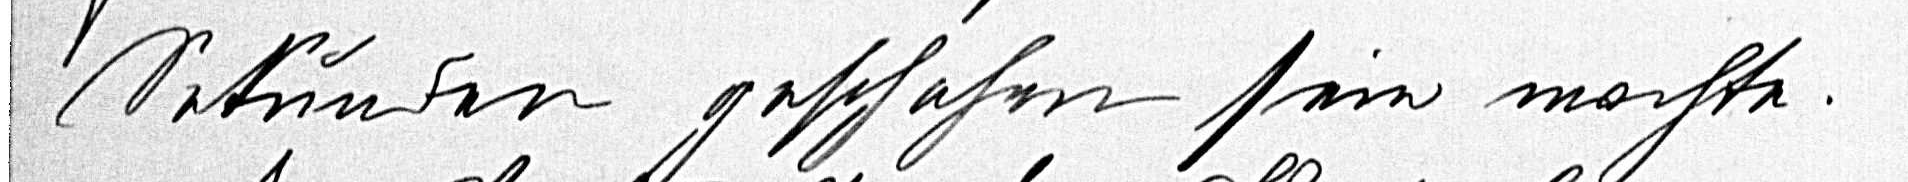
Sekunden geschehen sein mochte.
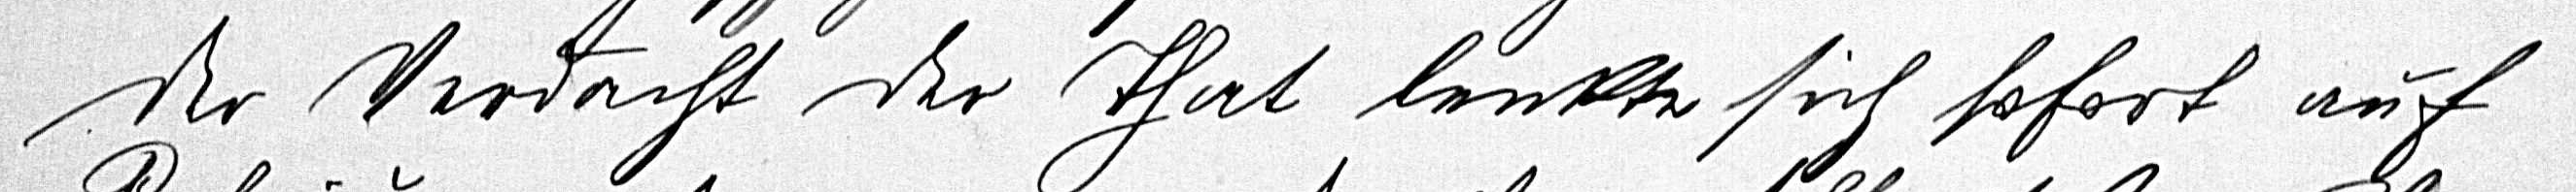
Der Verdacht der That lenkte sich sofort auf
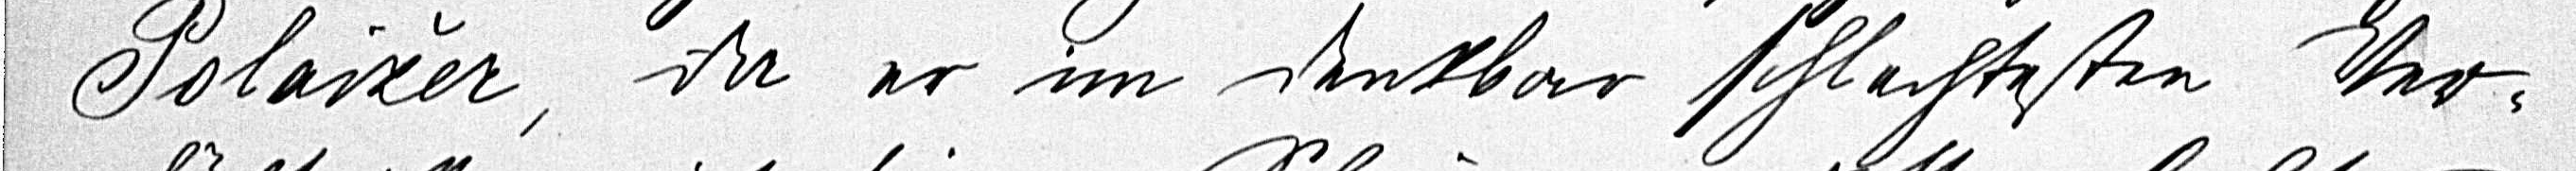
Polaižer, da er im denkbar schlechtesten Ver¬
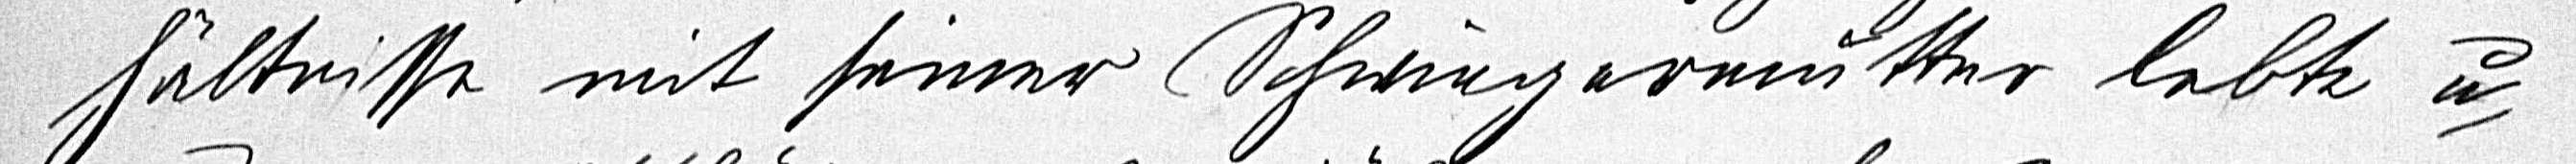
hältnisse mit seiner Schwiegermutter lebte u.
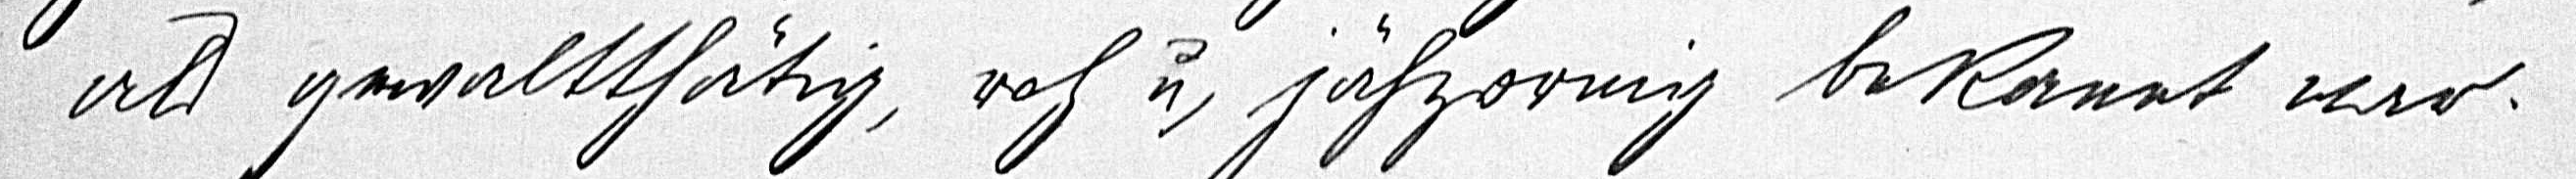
als gewalthätig, roh u. jähzornig bekannt war.
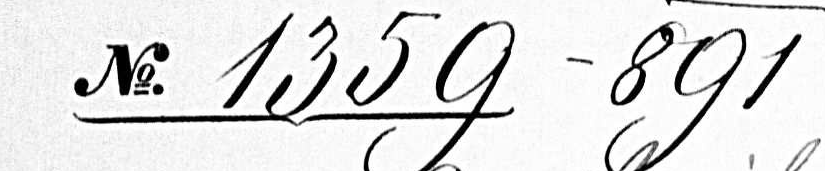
No 1359– 1891
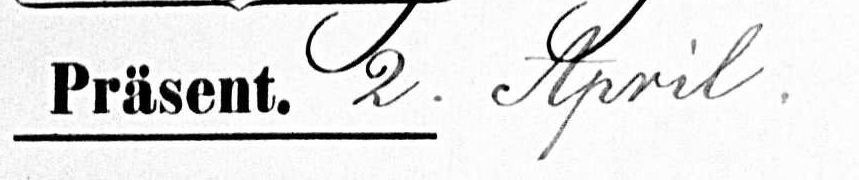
Präsent. – 2. April
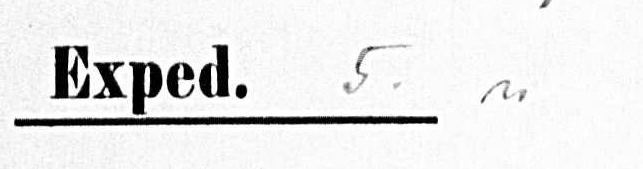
Exped. – 5. April
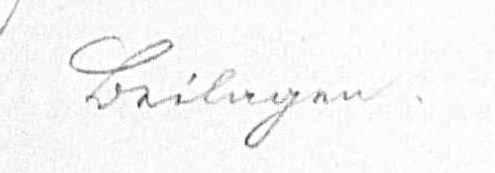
Beilagen
